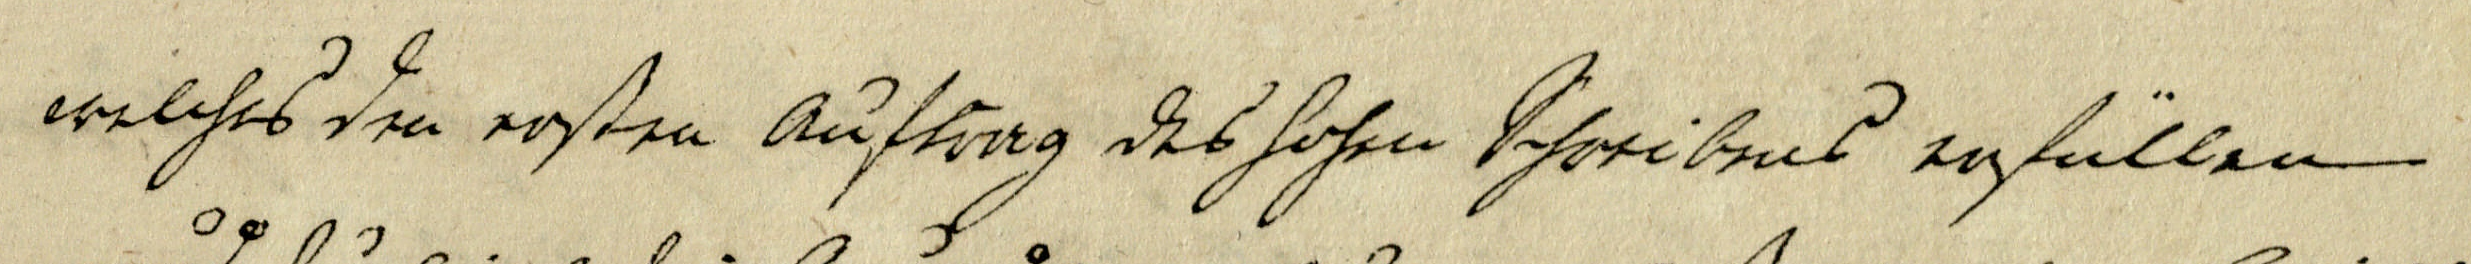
welches den ersten Auftrag des hohen Schreibens erfüllen
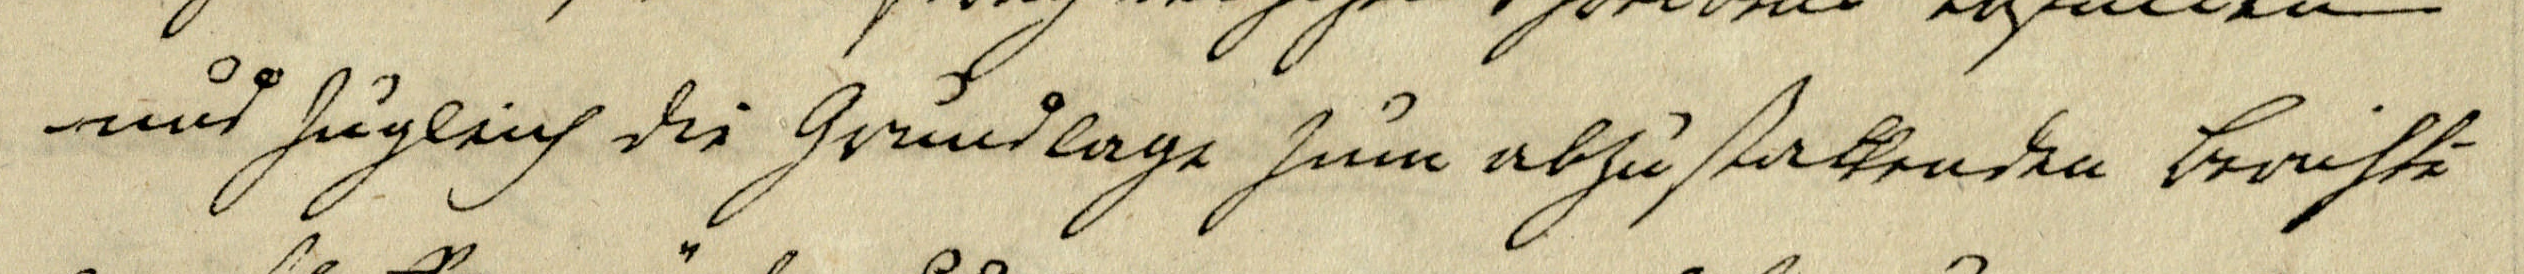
und zugleich die Grundlage zum abzustattenden Berichte
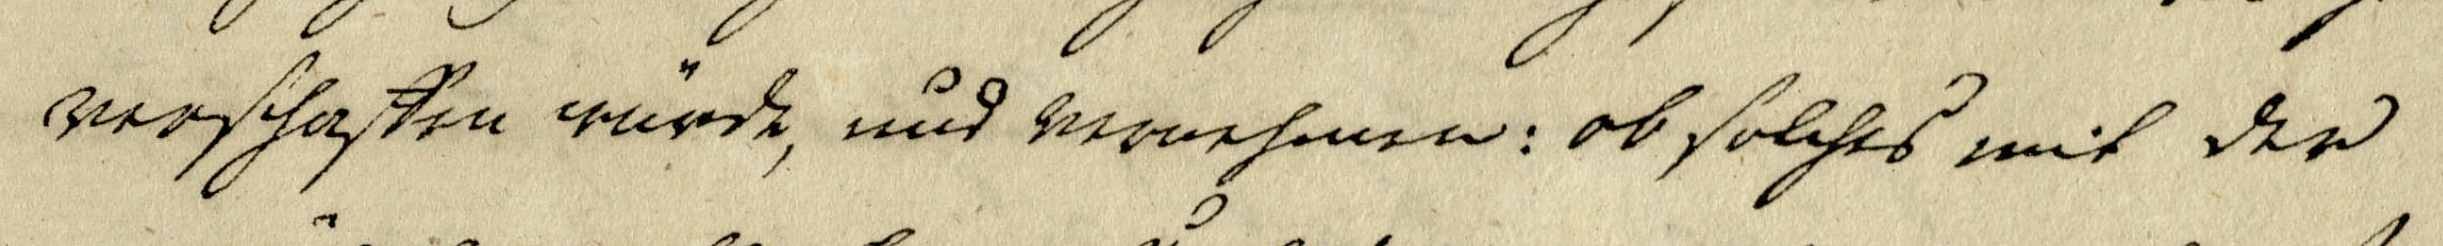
verschaffen würde, und vernehmen: ob solches mit der
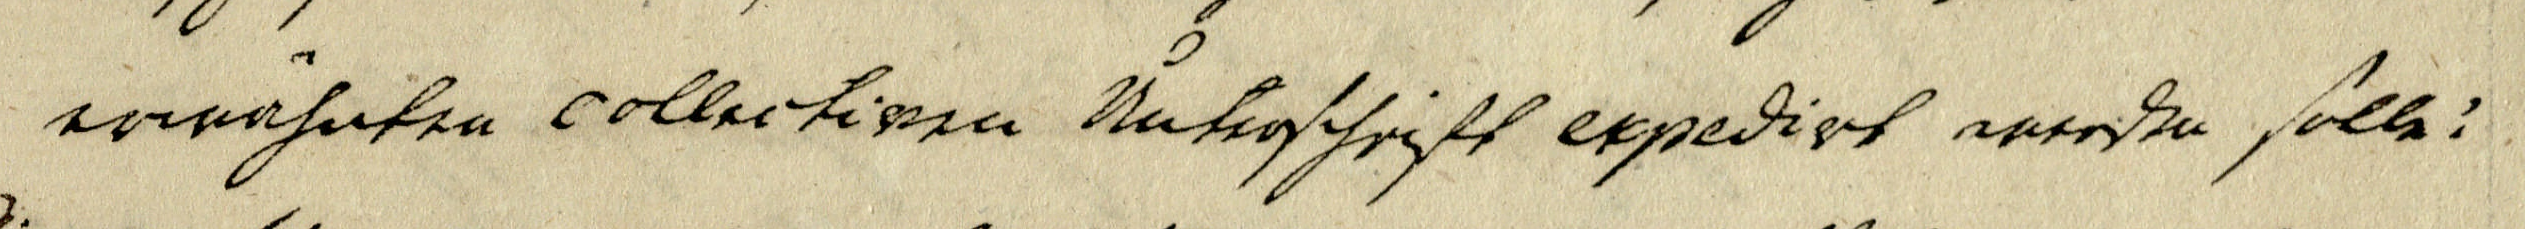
erwähnten collectiven Unterschrift expedirt werden solle?
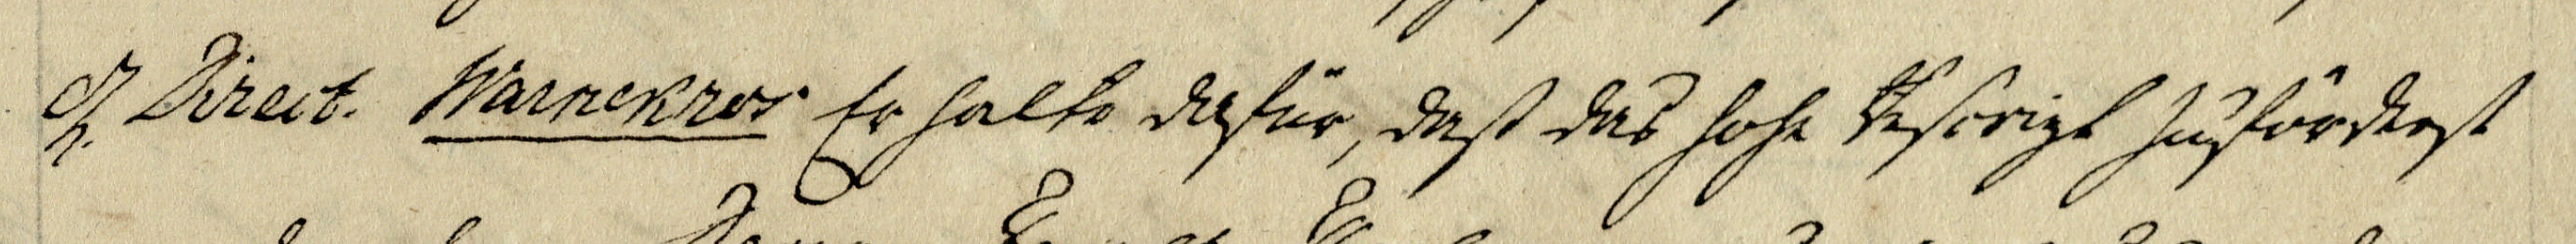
dh Direct. Warnekros Er halte dafür, daß das hohe Rescript zuförderst
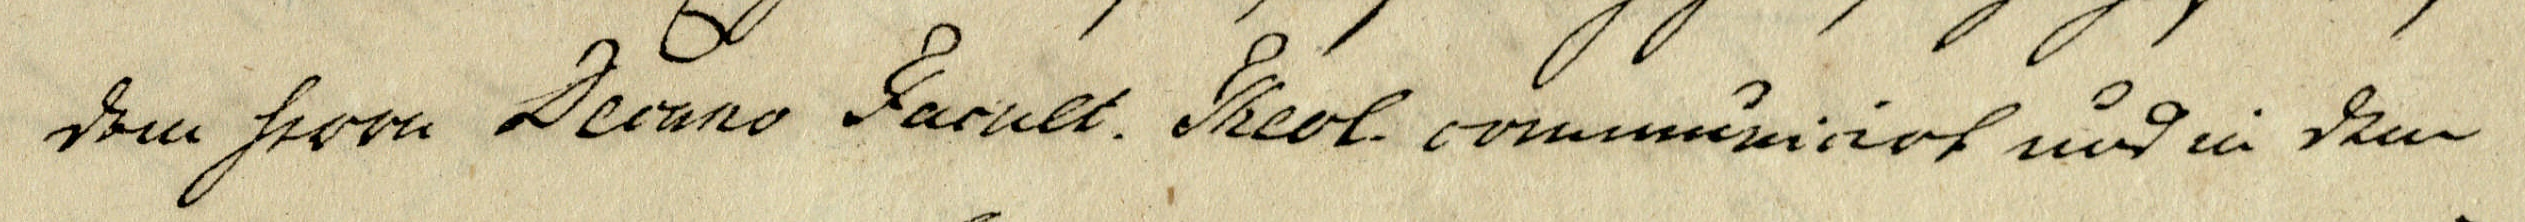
dem Herrn Decano Facult. Theol. communicirt und in dem
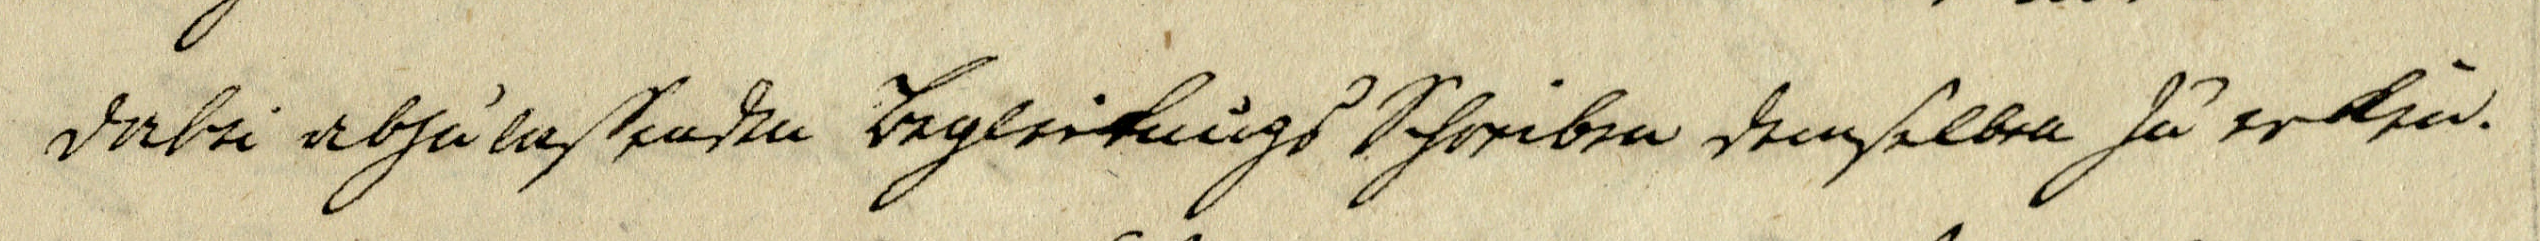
dabei abzulassenden Begleitungs Schreiben demselben zu erken¬
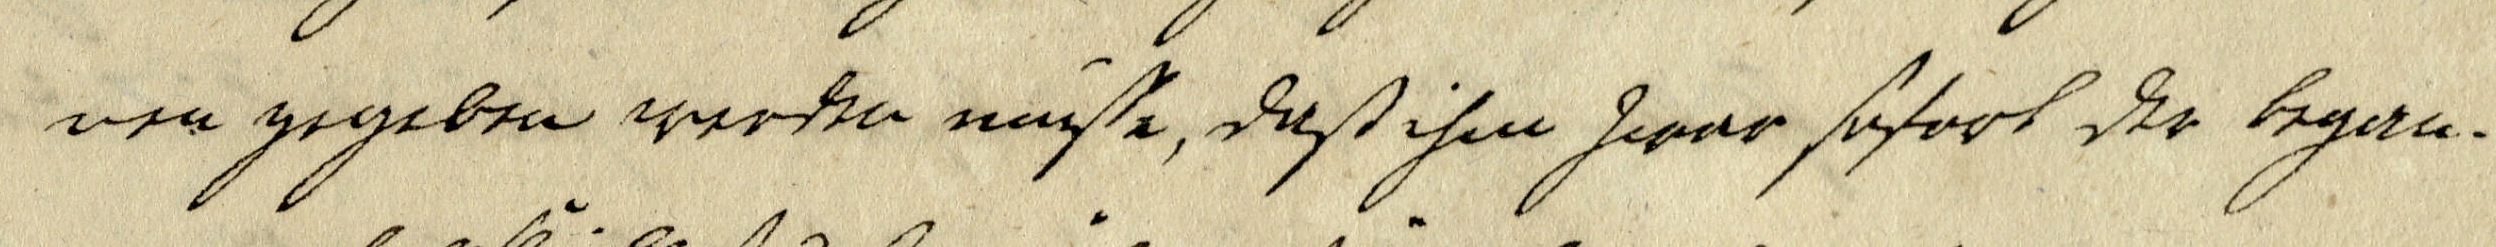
nen gegeben werden müsse, daß ihm zwar sofort der began¬
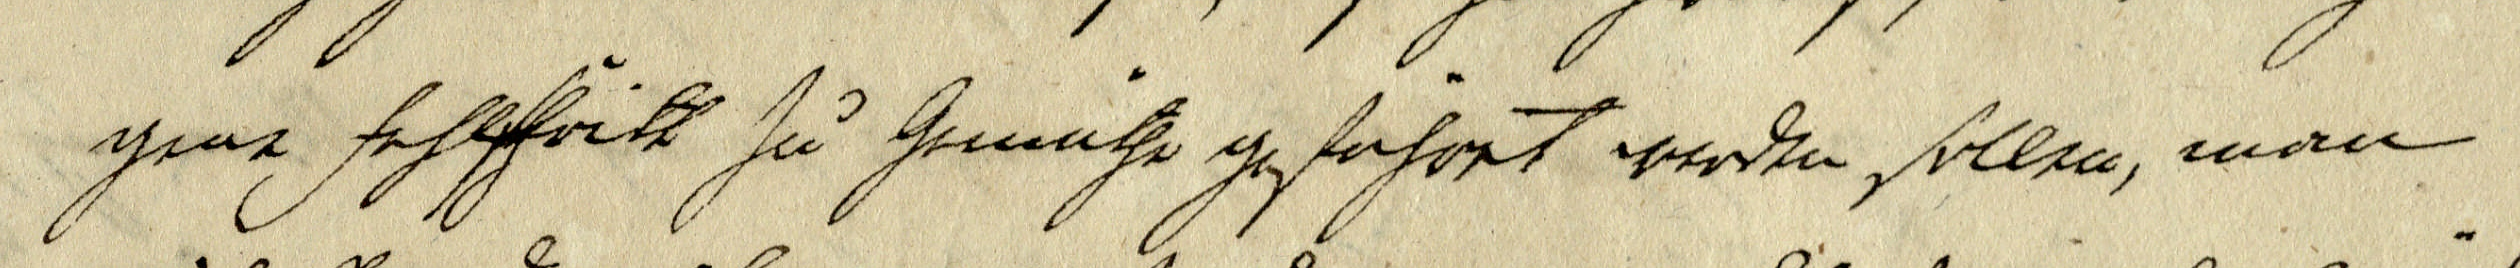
gene Fehltritt zu Gemüthe geführet werden sollen, man
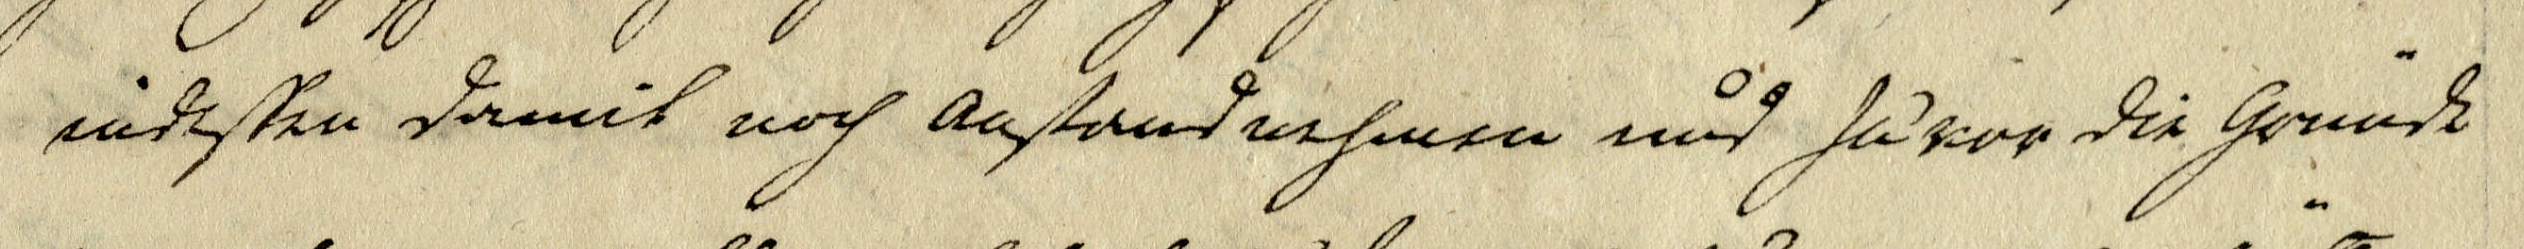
indessen damit noch Anstand nehmen und zuvor die Gründe
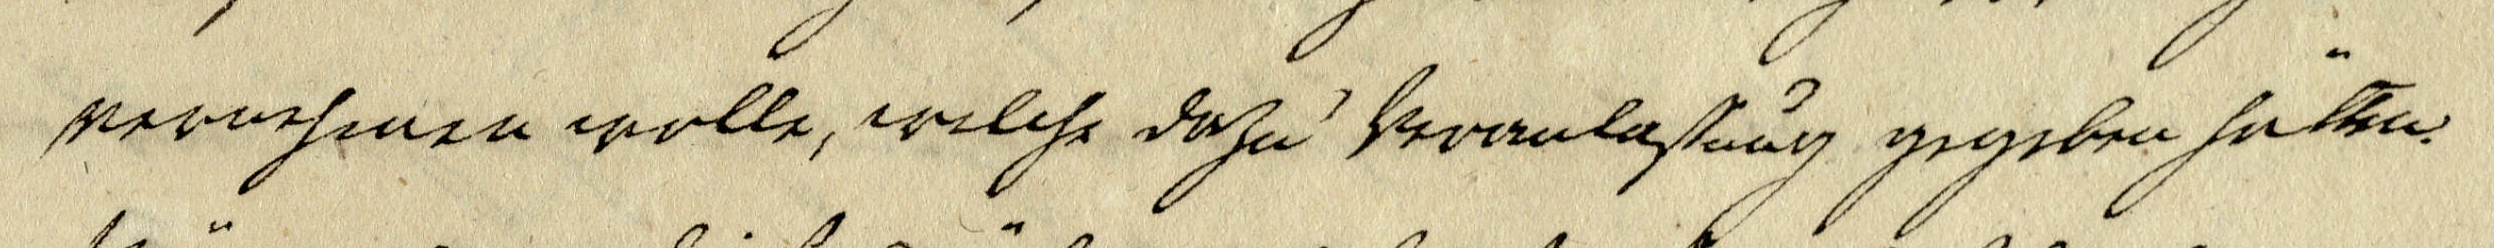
vernehmen wolle, welche dazu Veranlassung gegeben hätten.
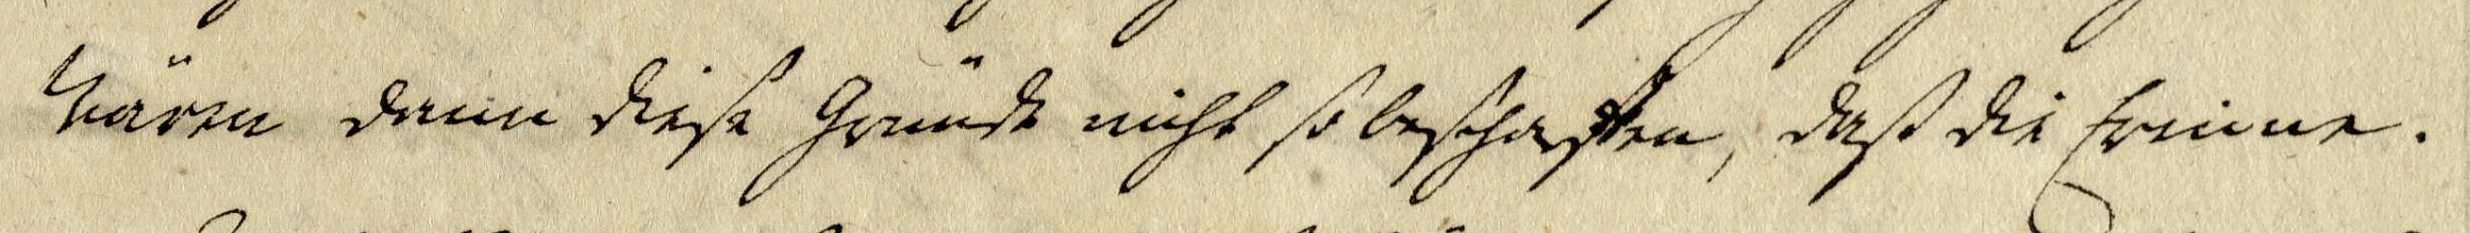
Wären dann diese Gründe nicht so beschaffen, daß die Erinne¬
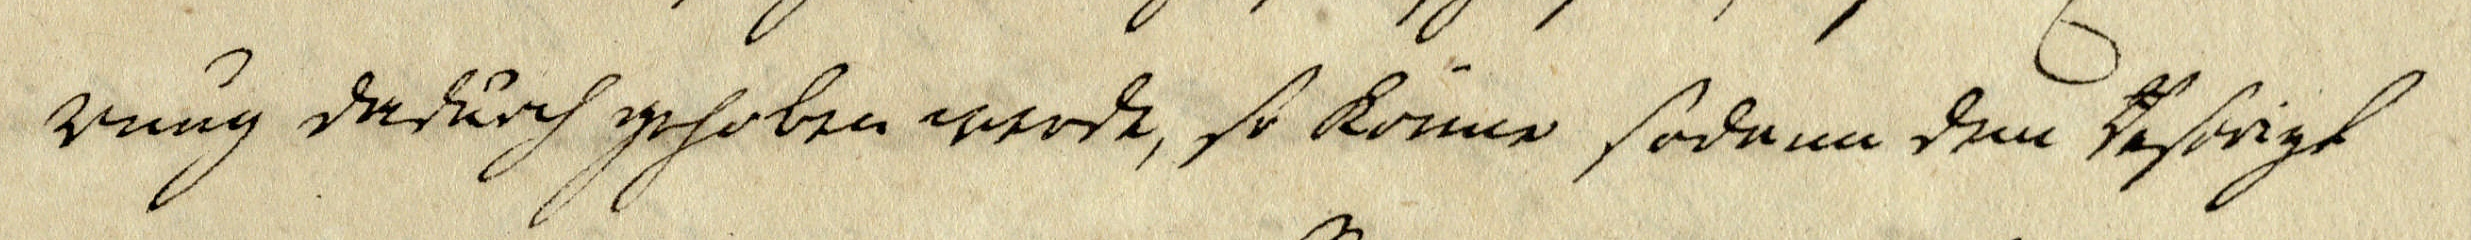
rung dadurch gehoben werde, so könne sodann dem Rescript
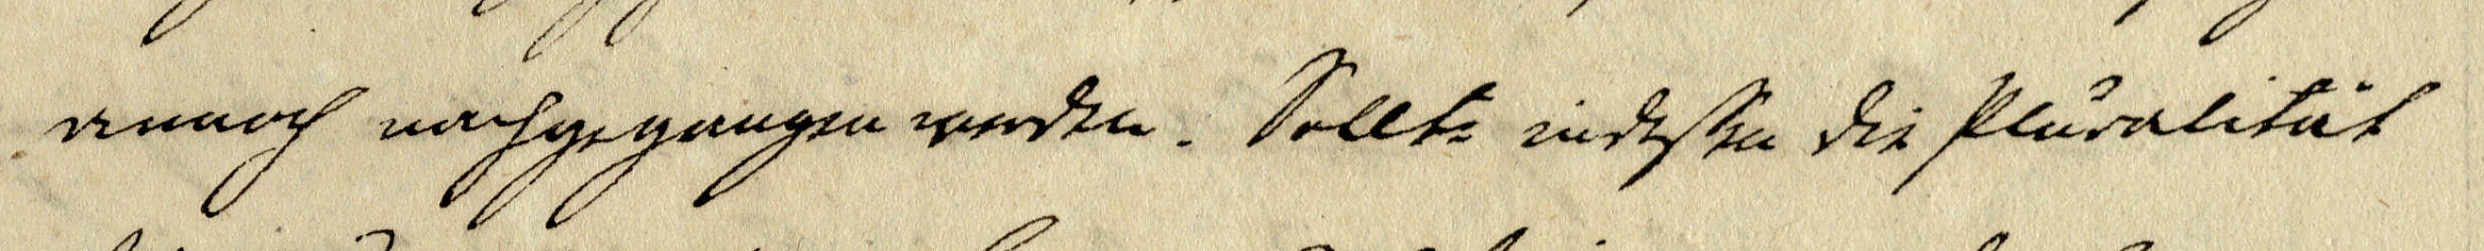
annoch nachgegangen werden. Sollte indessen die Pluralität
